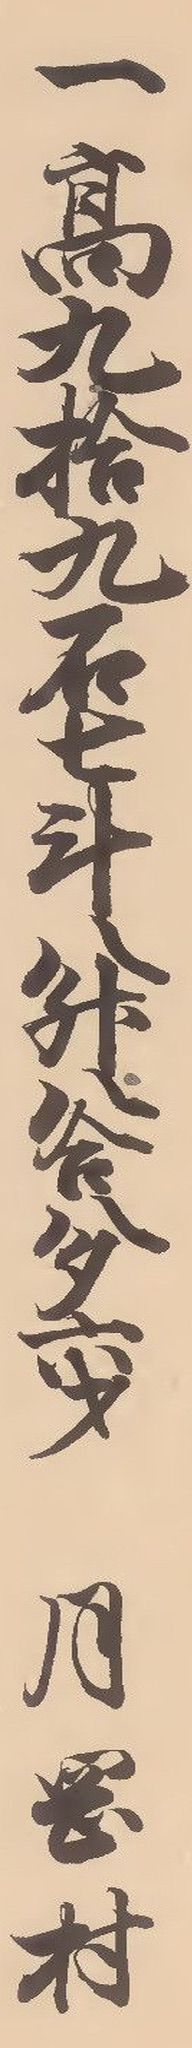一高九拾九石七斗八升八合八勺六才月岡村
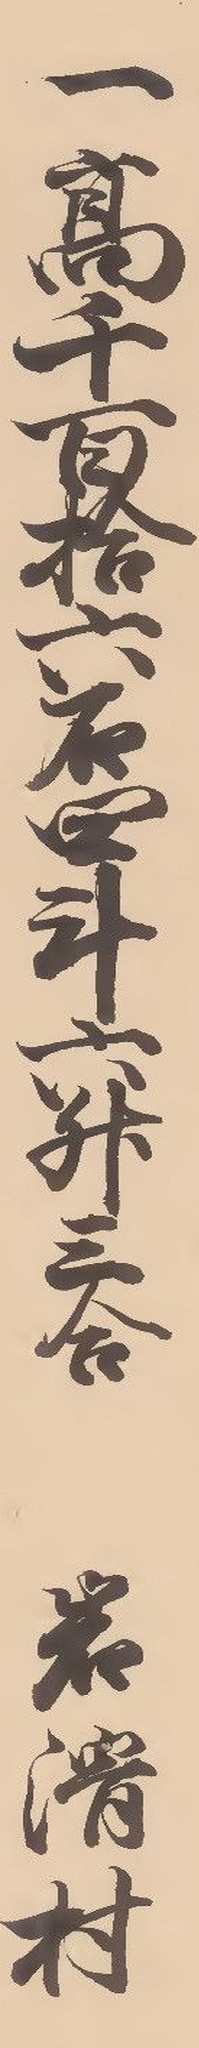一高千百拾六石四斗六升三合岩滑村
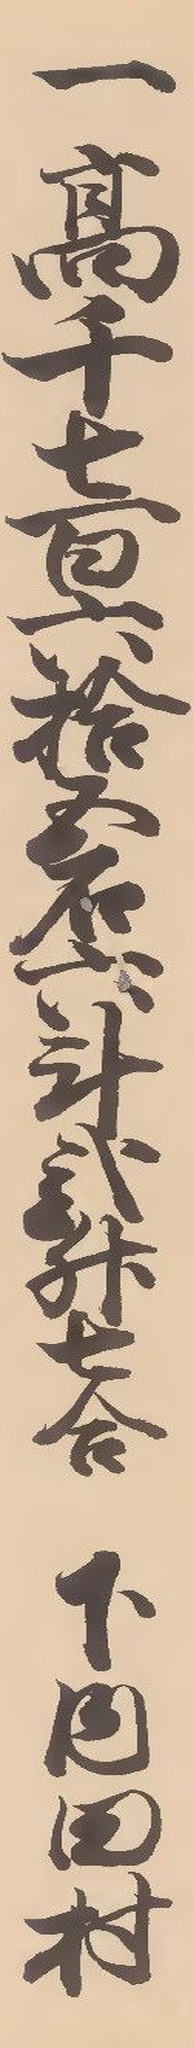一高千七百六拾五石六斗弐升七合下内田村
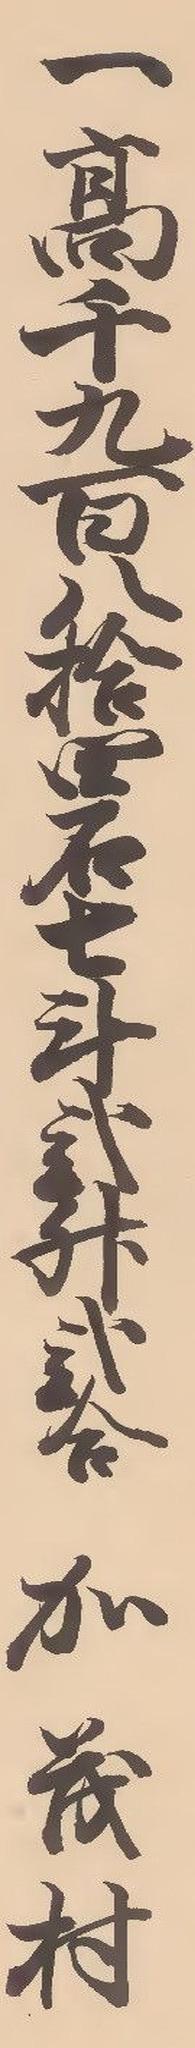一高千九百八拾四石七斗弐升弐合加茂村
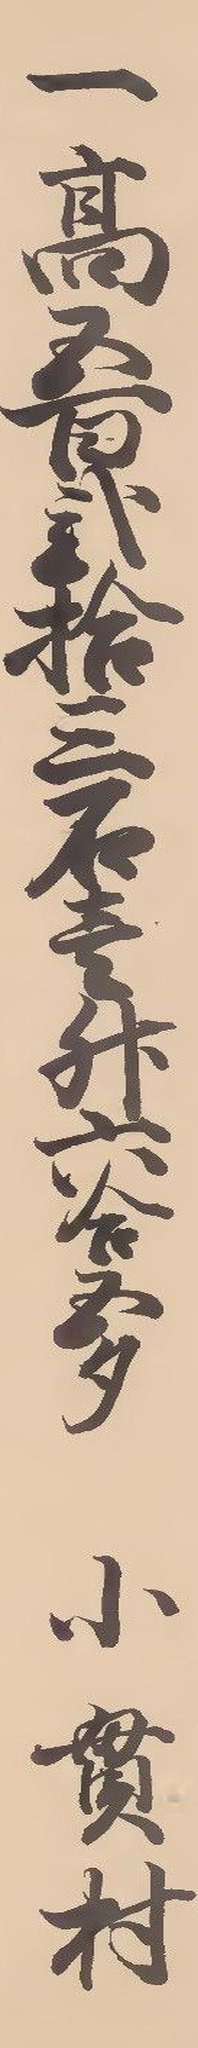一高五百弐拾三石壱升六合五勺小貫村
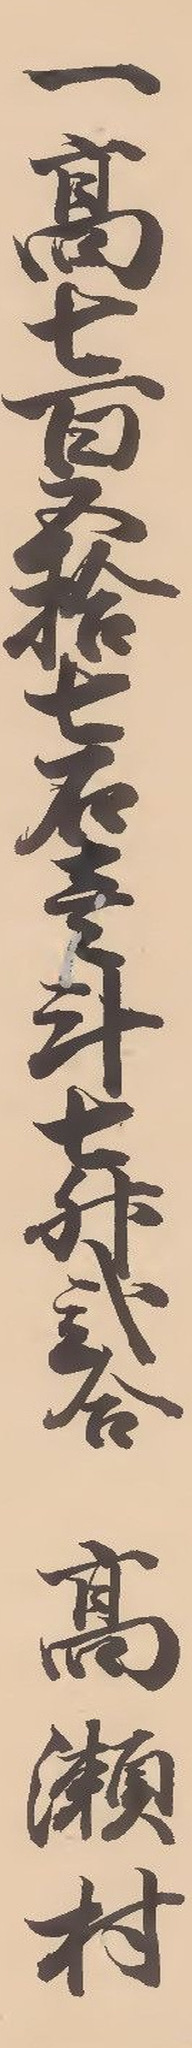一高七百五拾七石壱斗七升弐合高瀬村
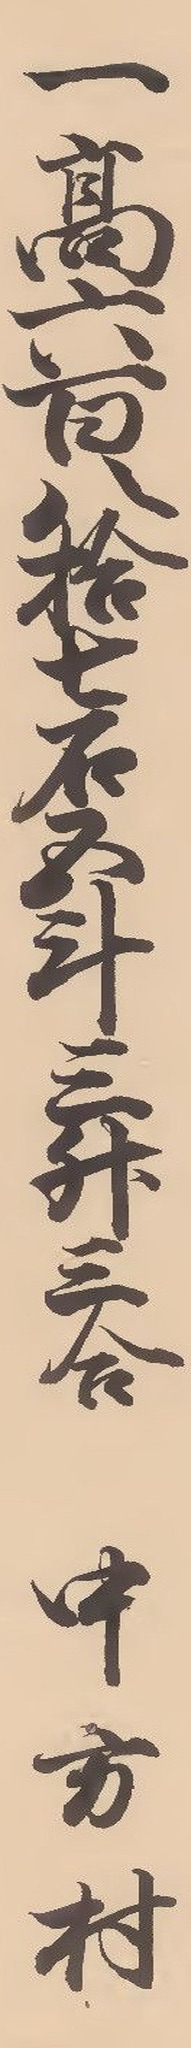一高六百八拾七石五斗三升三合中方村
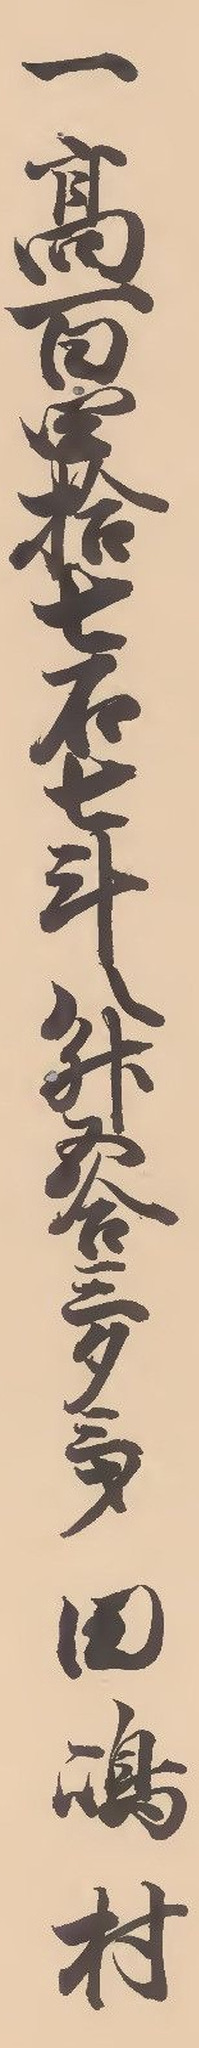一高百四拾七石七斗八升五合三勺三才田島村

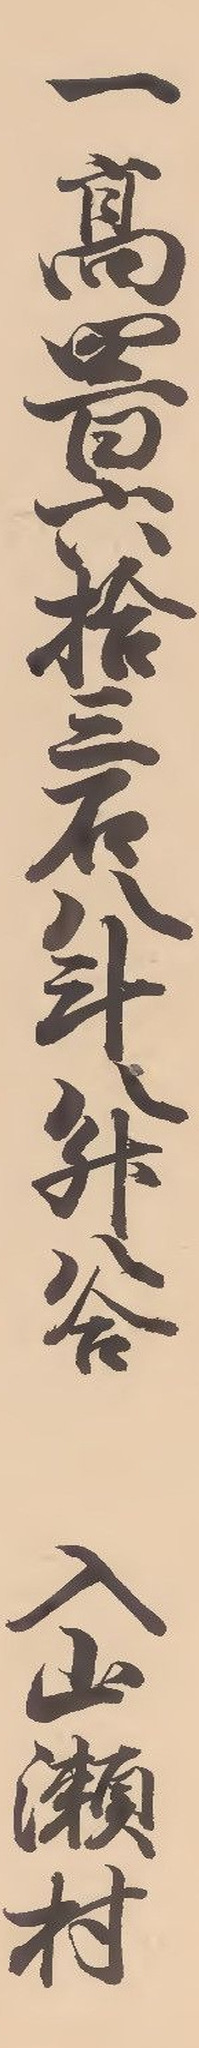一高四百六拾三石八斗八升八合入山瀬村
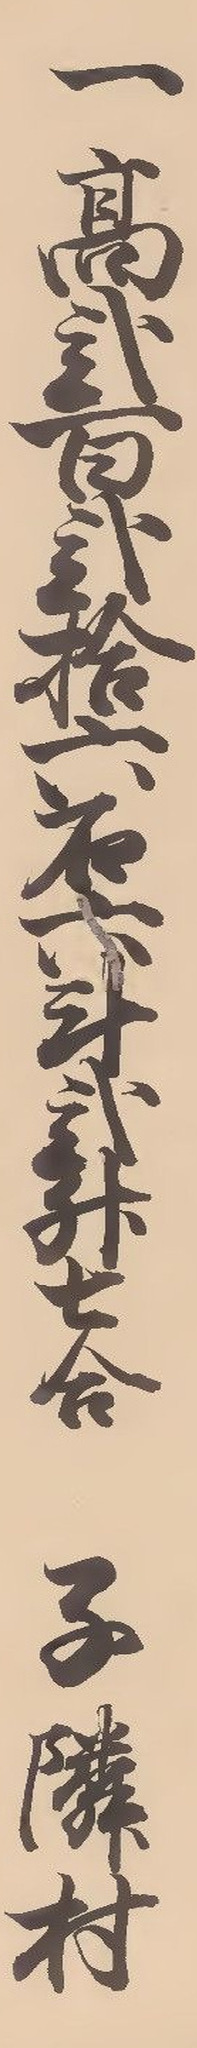一高弐百弐拾六石六斗弐升七合子隣村
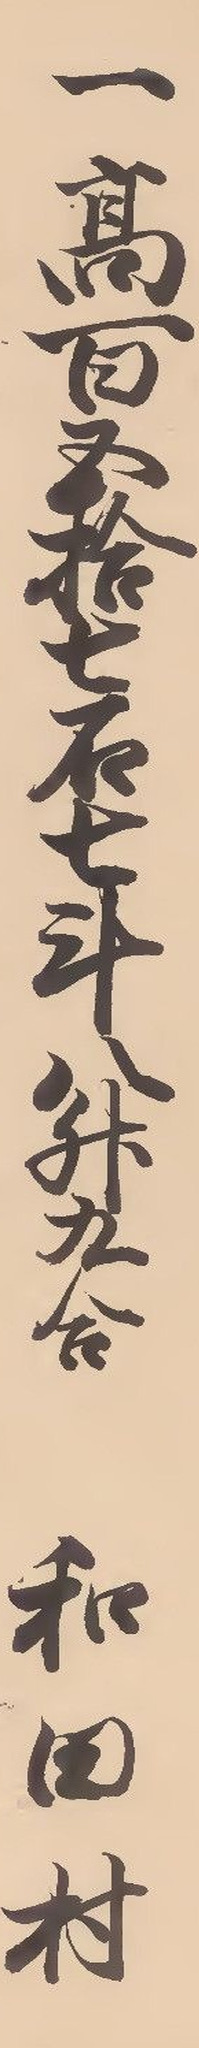一高百五拾七石七斗八升九合和田村
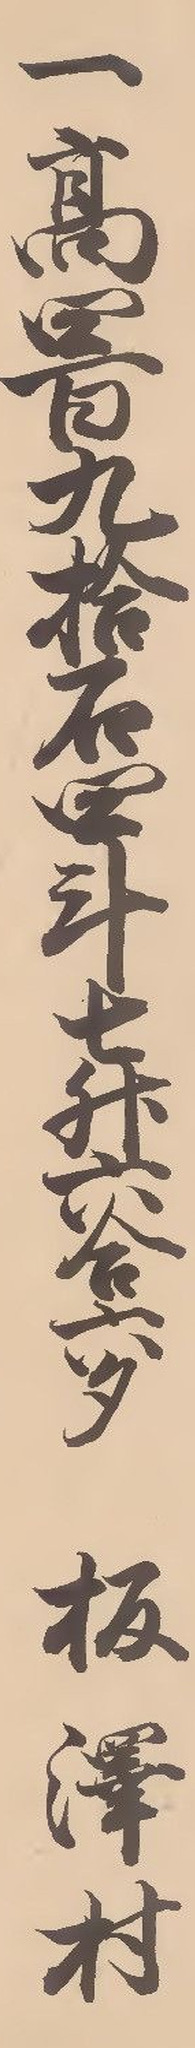一高四百九拾石四斗七升六合六勺板沢村
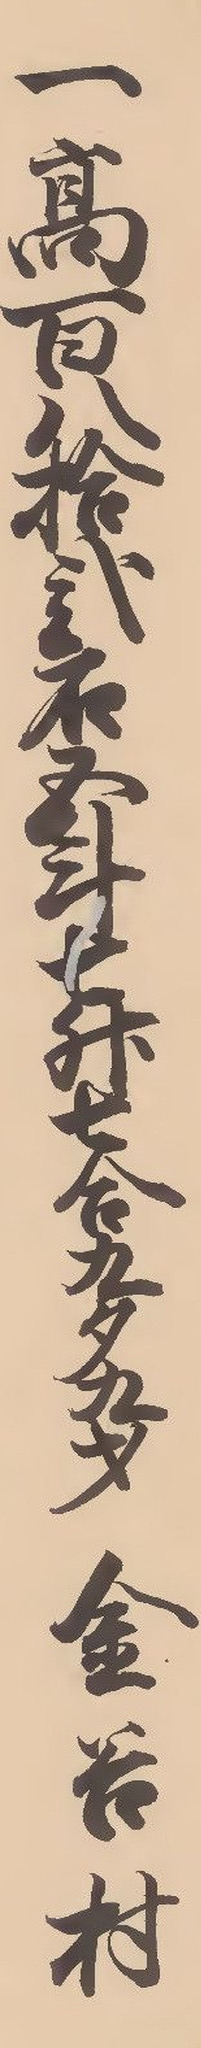一高百八拾弐石五斗七升七合九勺九才金谷村
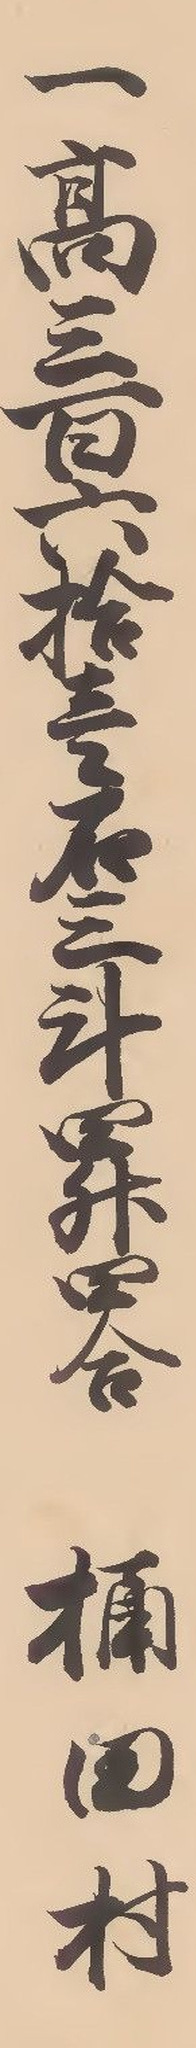一高三百六拾壱石三斗四升四合桶田村
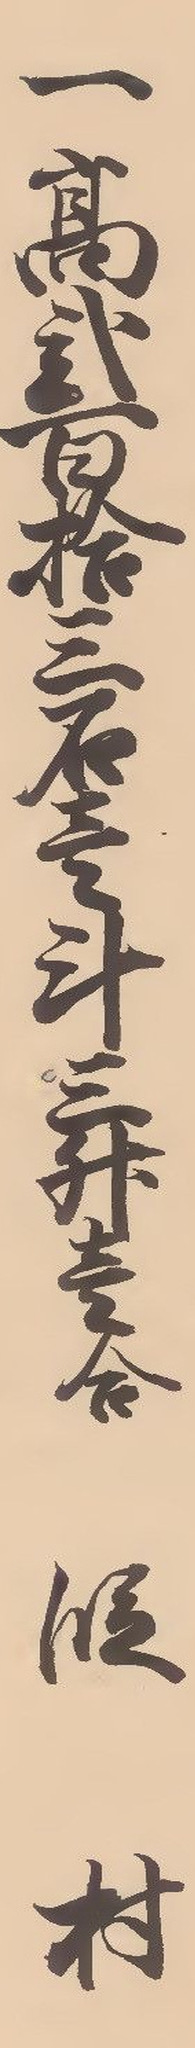一高弐百拾三石壱斗三升壱合段村

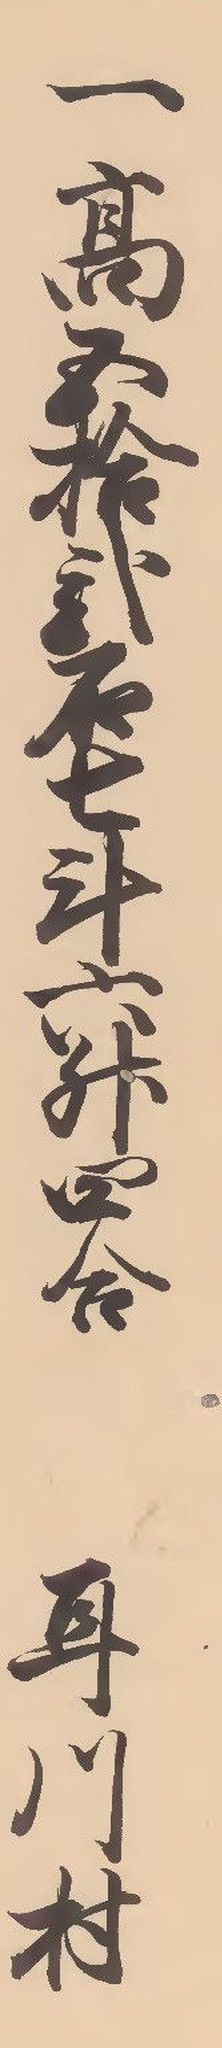一高五拾弐石七斗六升四合耳川村
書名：遠江国郷帳
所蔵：国立公文書館 National Archives of Japan
